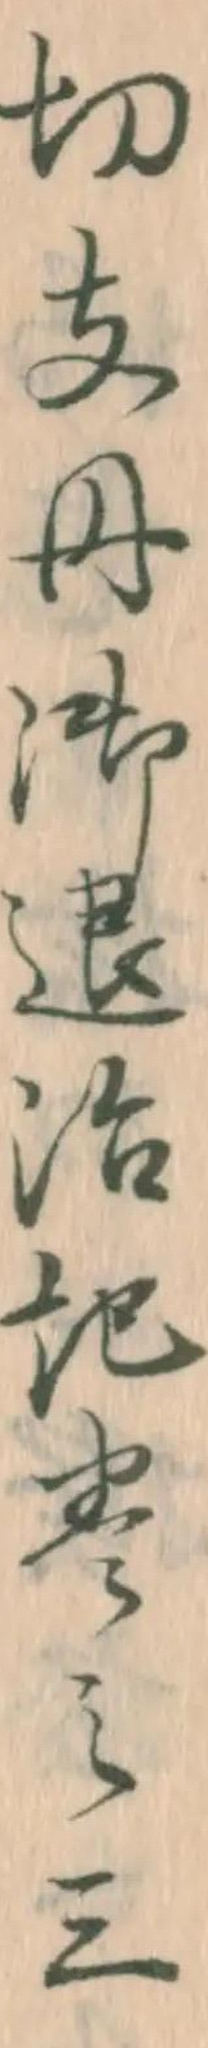切支丹御退治記巻之三
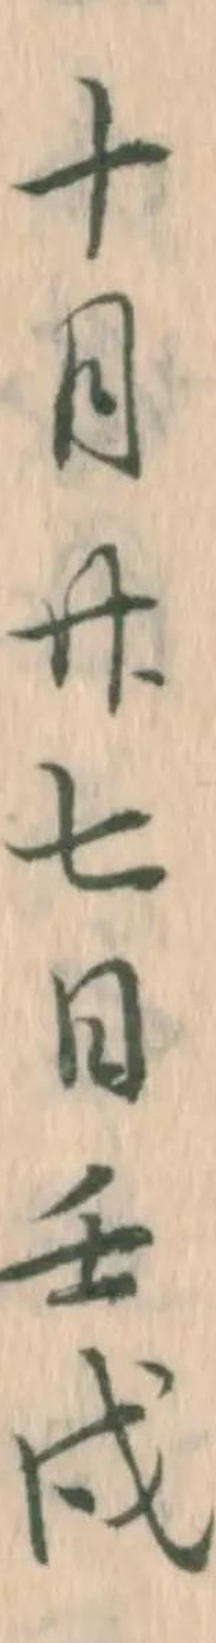十月廿七日壬戌
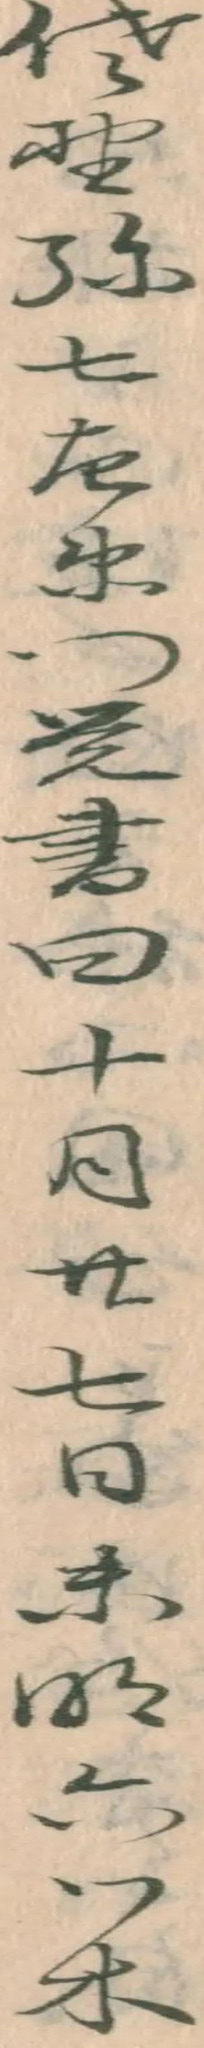佐野弥七左衛門覚書曰十月廿七日未明六つ木
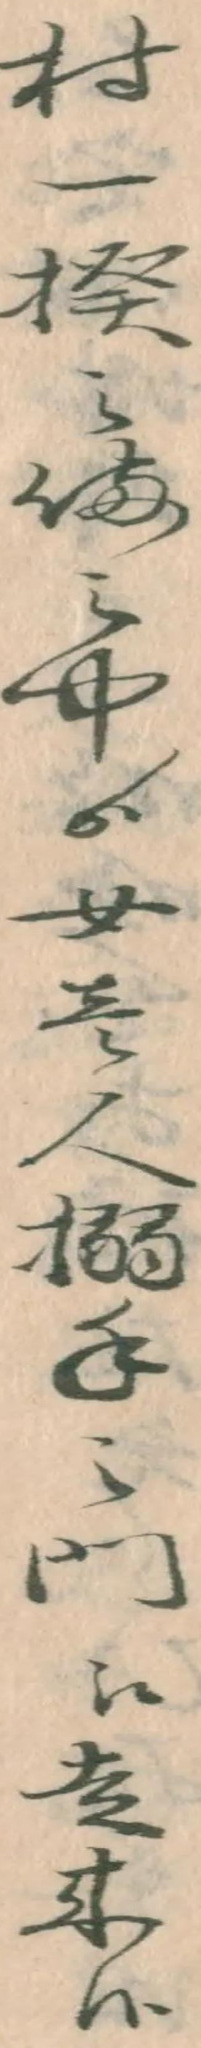村一揆之備之中ゟ女壱人搦手之門江走来候
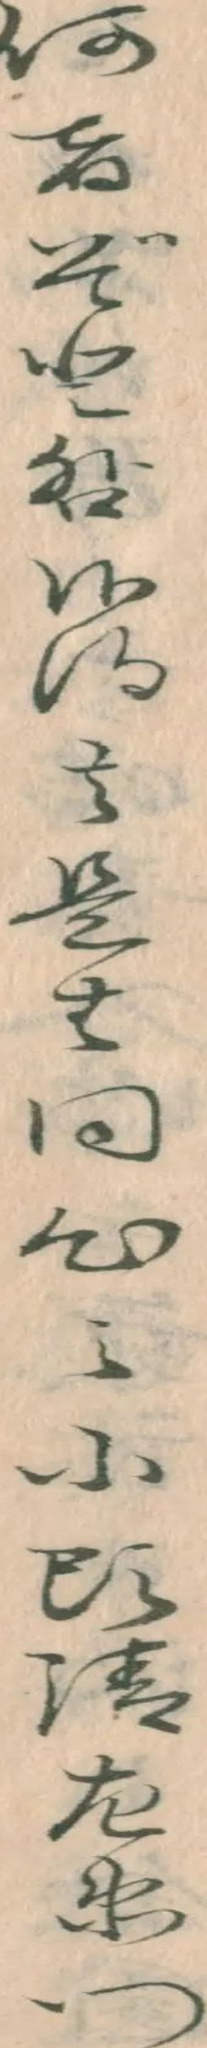何者ぞ登咎候得者是者同心之小頭清左衛門
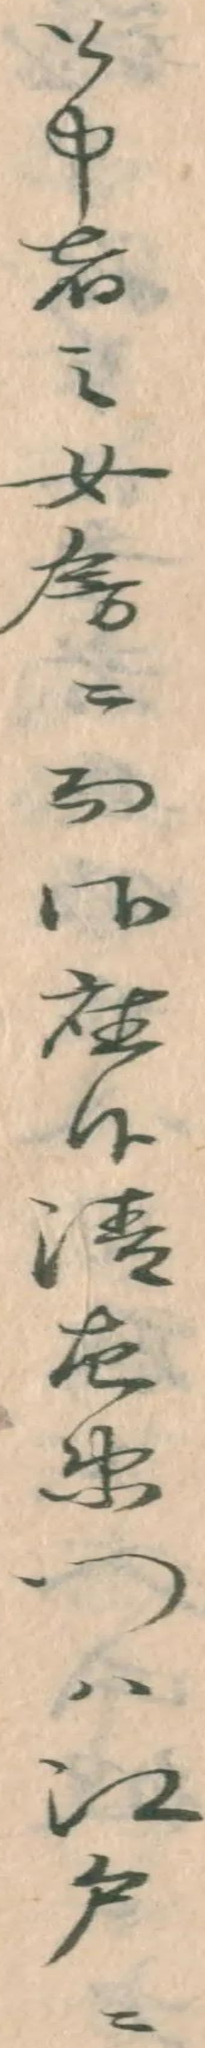と申者之女房に而御座候清左衛門は江戸に
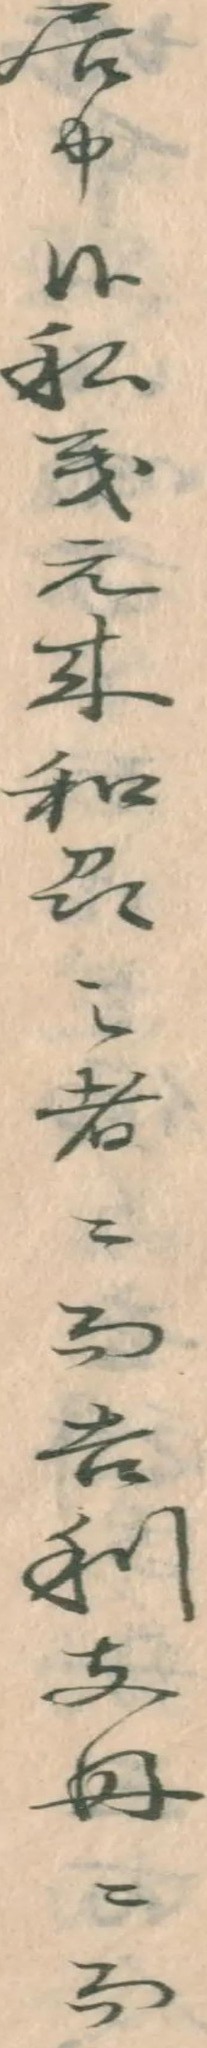居申候私義元来和州之者に而吉利支丹に而
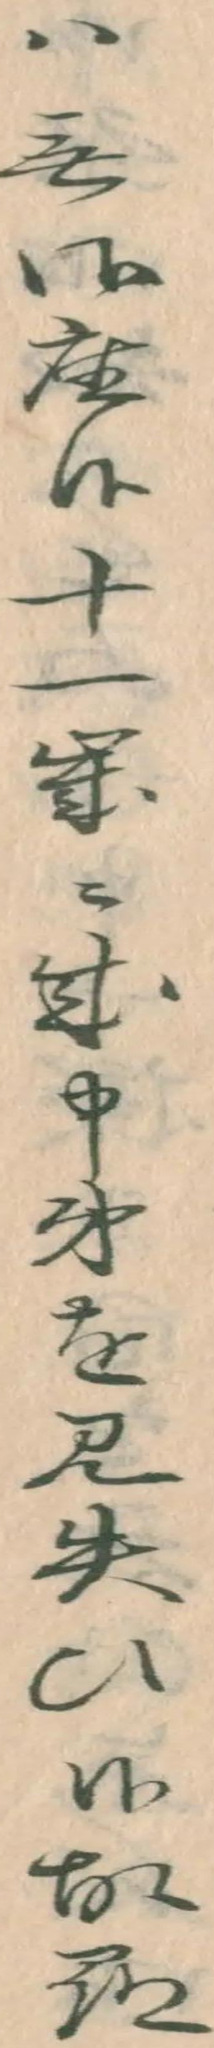は無御座候十一歳に成申弟を見失ひ候故尋
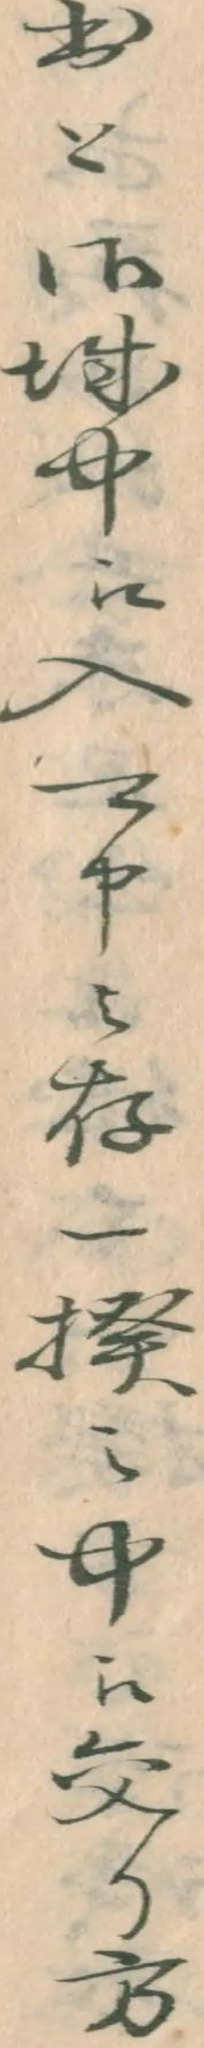出と御城中江入可申之存一揆之中江交り方

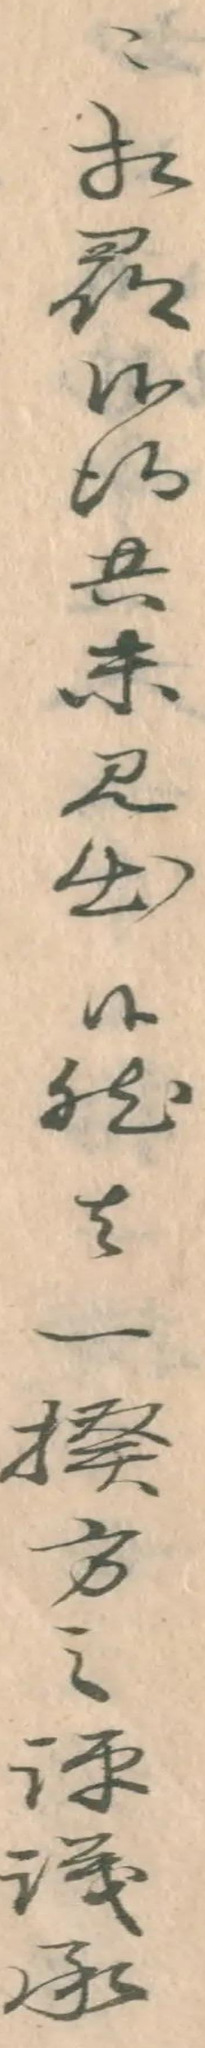に相尋候得共未見出候然者一揆方之評議承
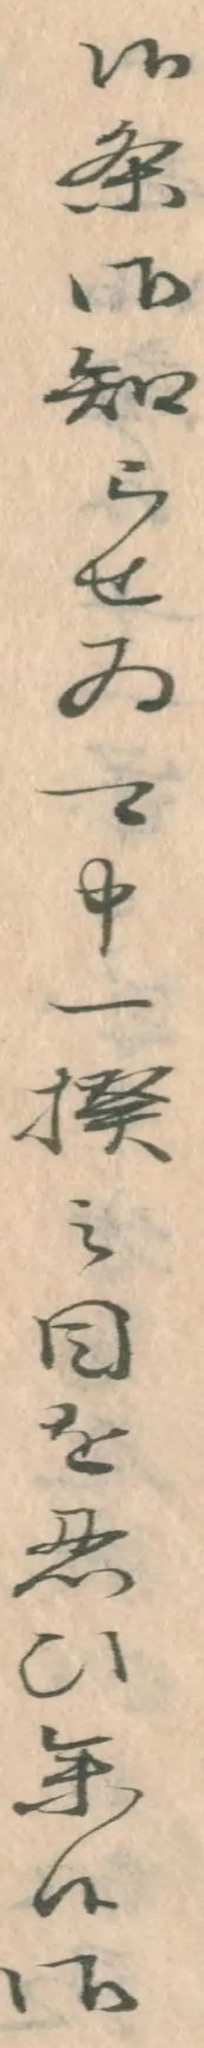候条御知らせゐ可申一揆之目を忍ひ参候御
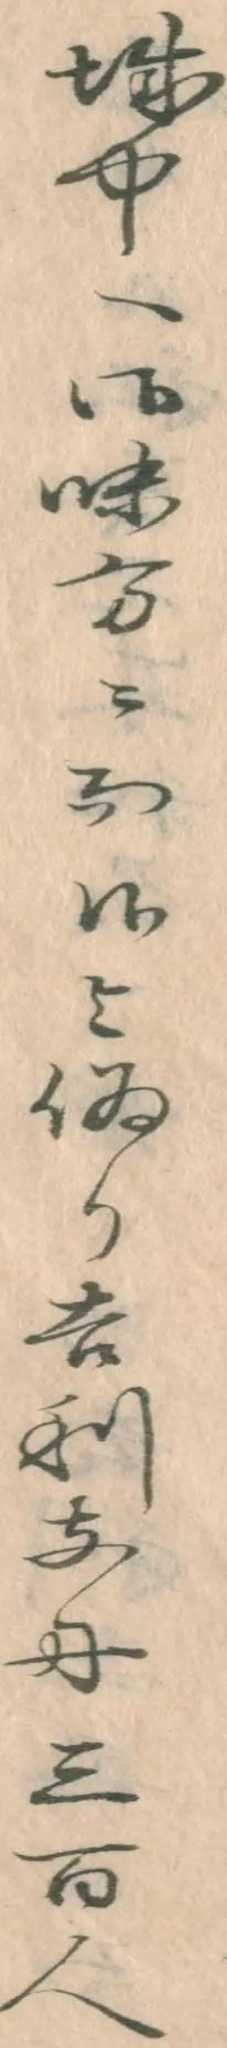城中へ御味方に而候与偽り吉利支丹三百人
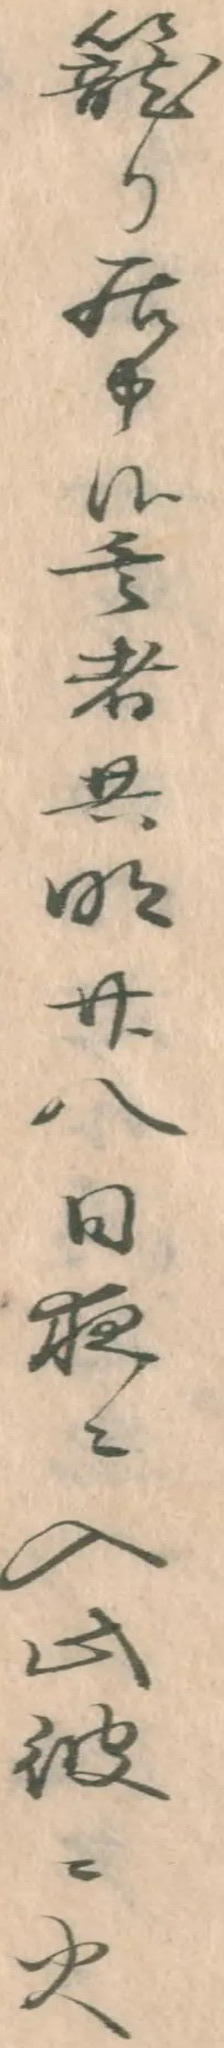籠り居申候其者共明廿八日夜に入此彼に火
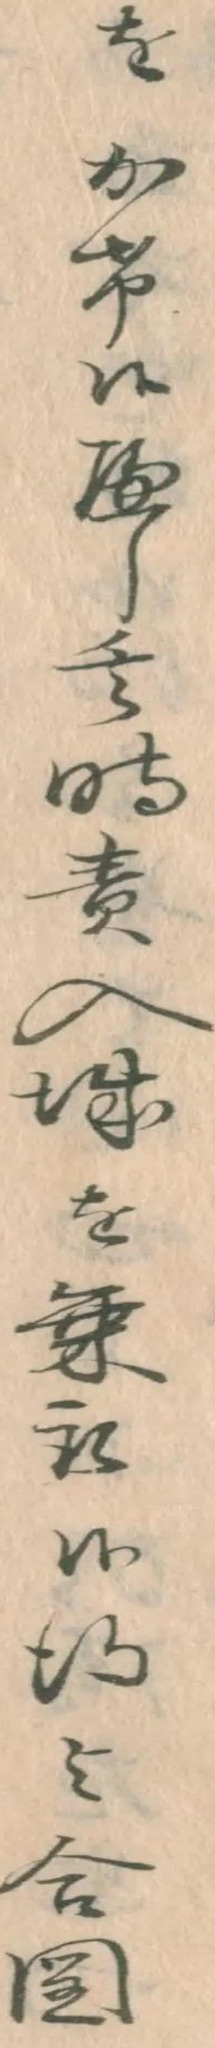をか希候扁し其時責入城を乗取候得与合図
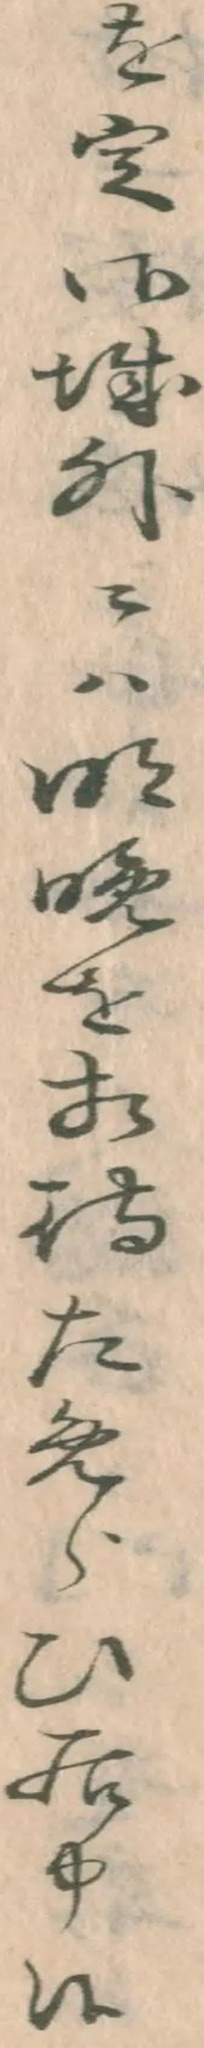を定御城外には明晩を相待た免らひ居申候
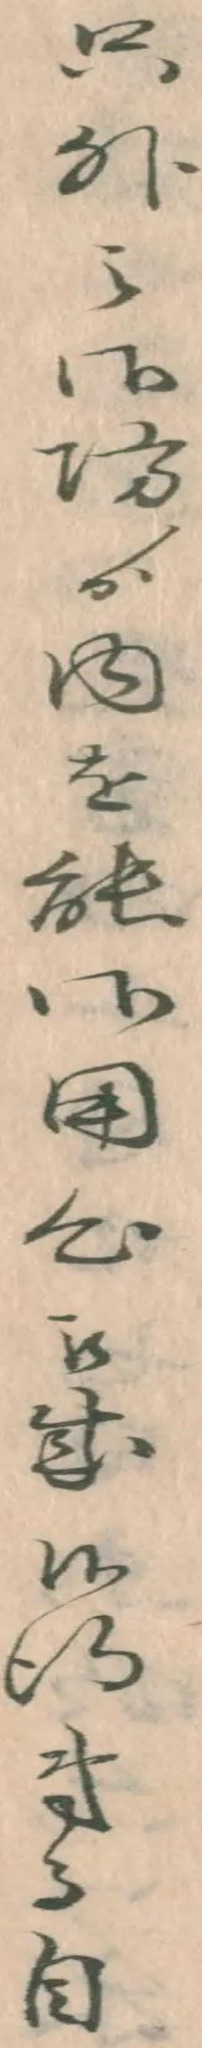只外之御防ゟ内を能御用心被成候得弟子自
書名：切支丹御退治記 49巻. [2]
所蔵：国立国会図書館 National Diet Library, JAPAN
